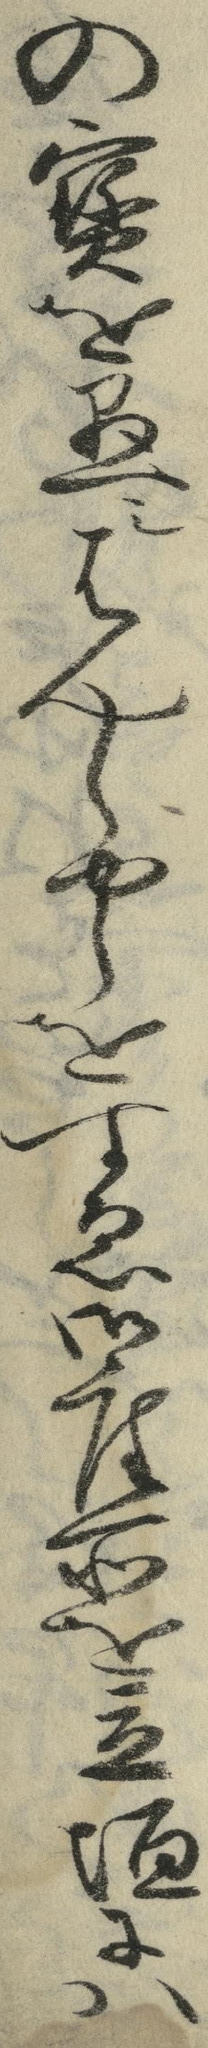の宝を尽シはんしやうをすゑ御座所を立垣には

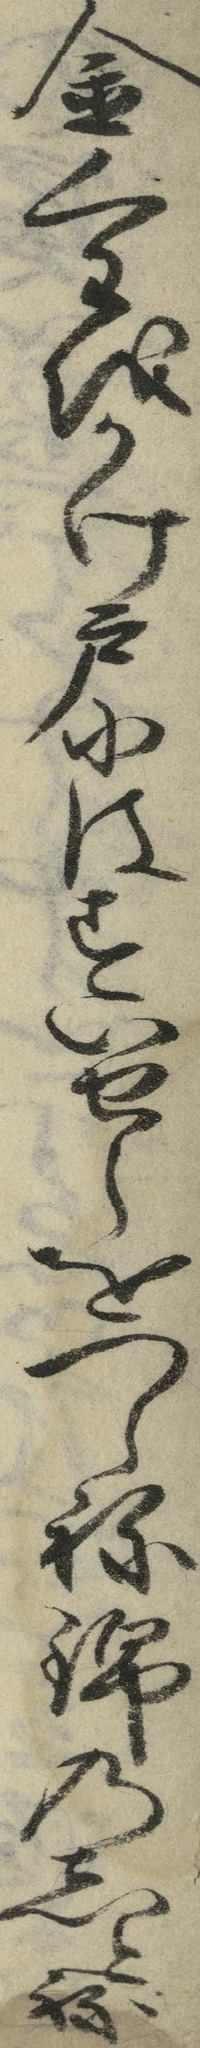金くわをかけ戸にはすいせうをつらね錦のしとね
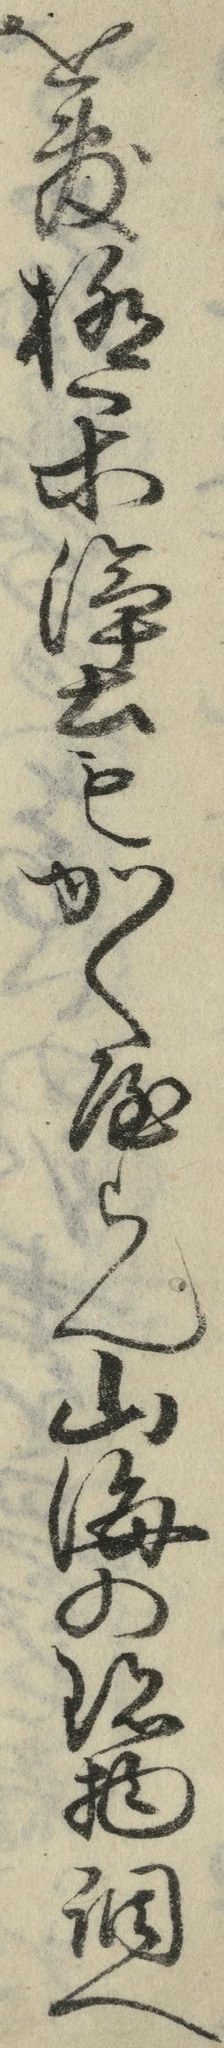を敷極楽浄土もかくやらん山海の珍物調へ
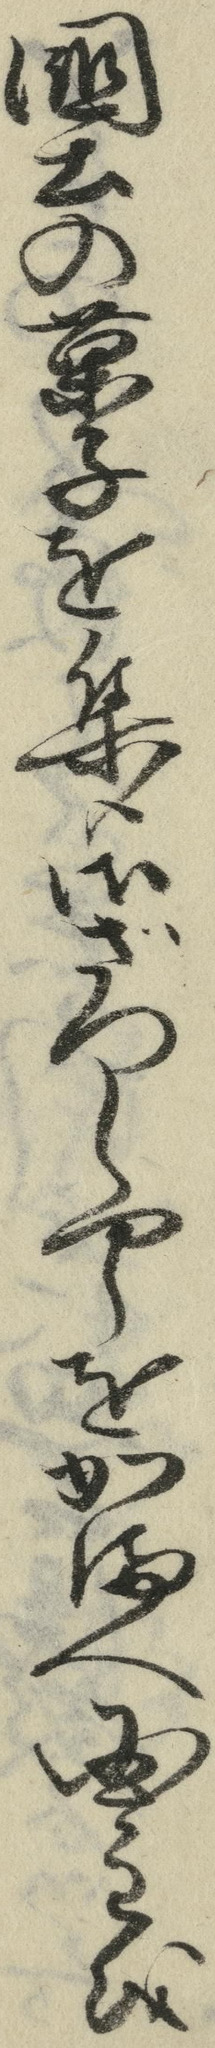国土の菓子を集御ざつしやうをかまへ国主を
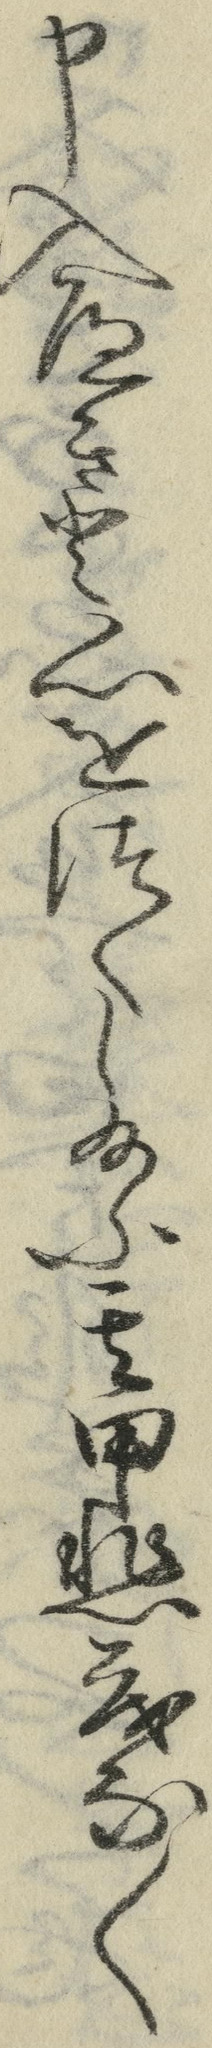申入へきと心をつくし給ふ其甲ひもなく
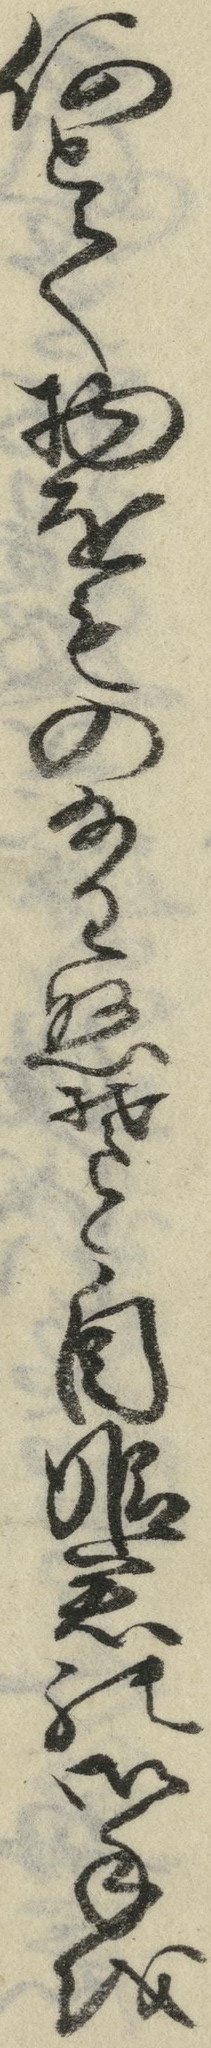何とて物をもの給わぬそと自姫君の御手を
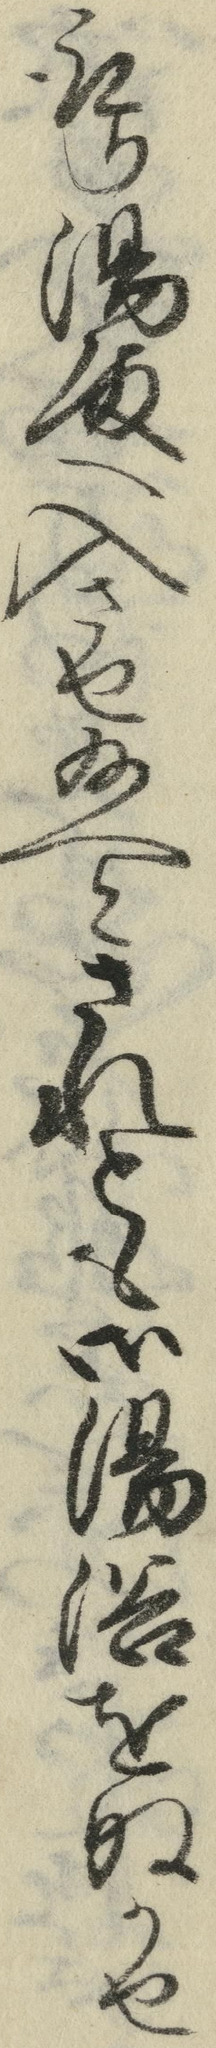取り湯殿へ入させ給へとされとも御湯浴をぬかせ
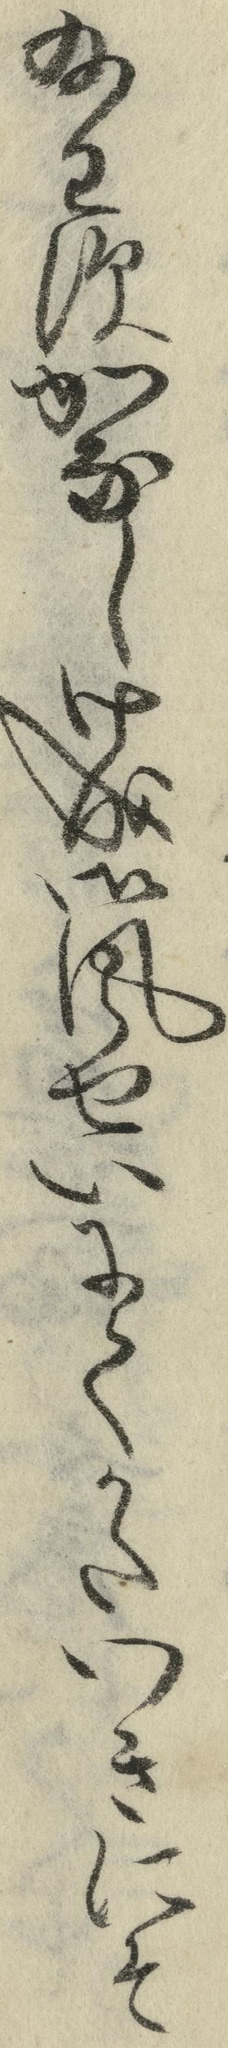給わすかなしけ成御風せいにてかたわきにそ
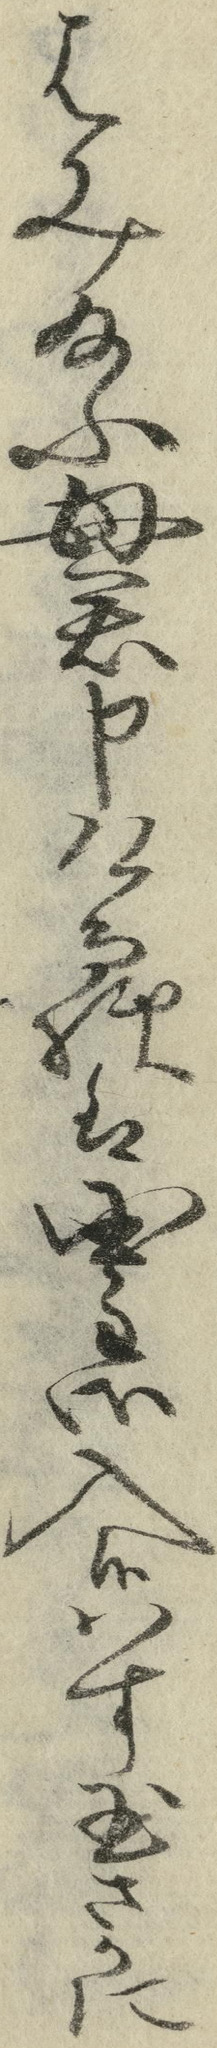はみ給ふ母君申ける様は国主御入候はす玉さかに
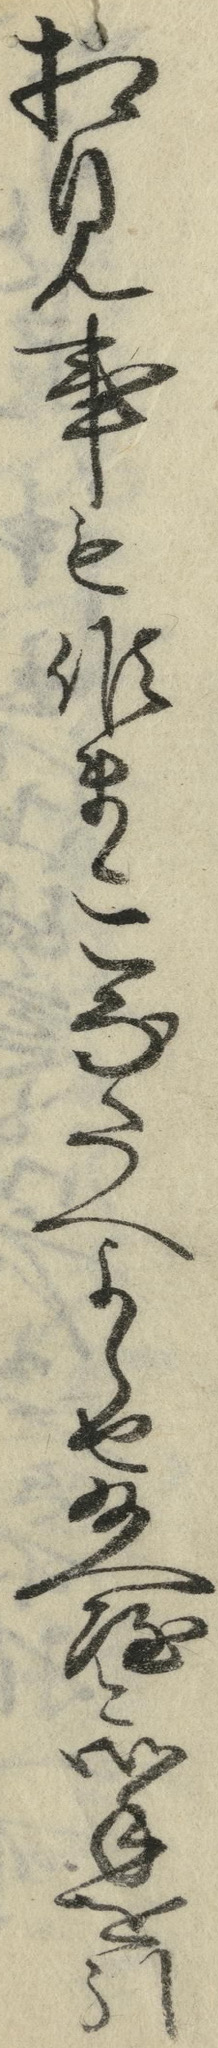相見事も候まゝこなたへよらせ給へやと御手を引
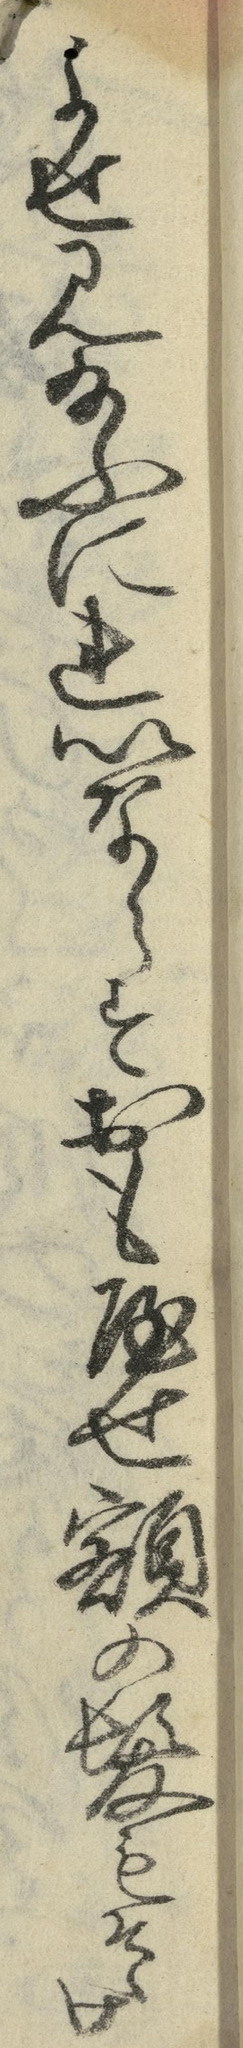よせ見給ふにれいならすおもやせ額の髪もそゝけ
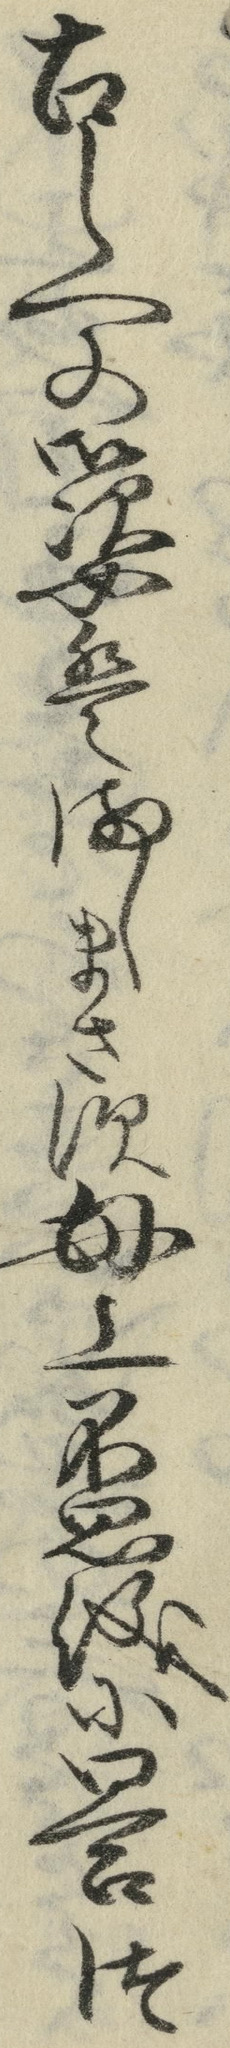古しへの御姿はましまさす母上不思議に思召つ
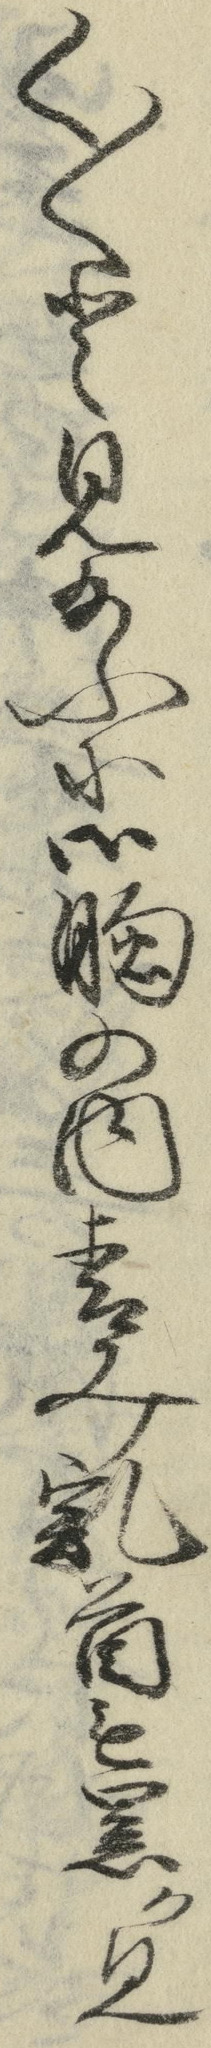く〳〵と見給うに御胸の内青み乳首も黒見
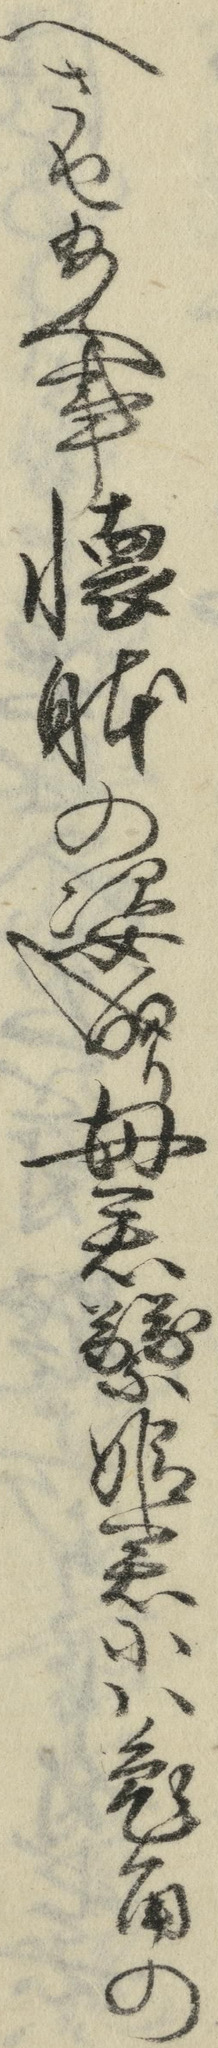へさせ給ふ事懐躰の姿成り母君姫君には兎角の
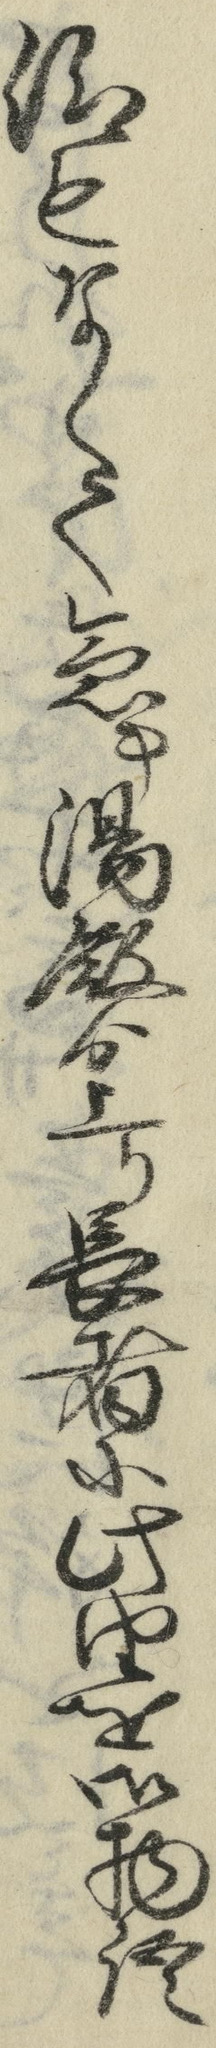仰もなくて急湯殿ゟ上り長者に此由を御物語
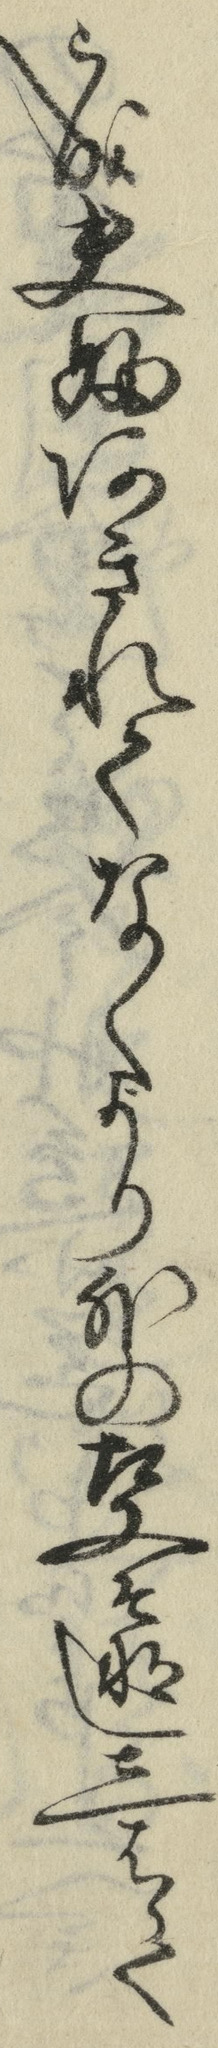被成夫婦あきれてなくより外の事そなししはらく
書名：浅間記
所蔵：東京大学地震研究所図書室 Earthquake Research Institute Library, The University of Tokyo, JAPAN
